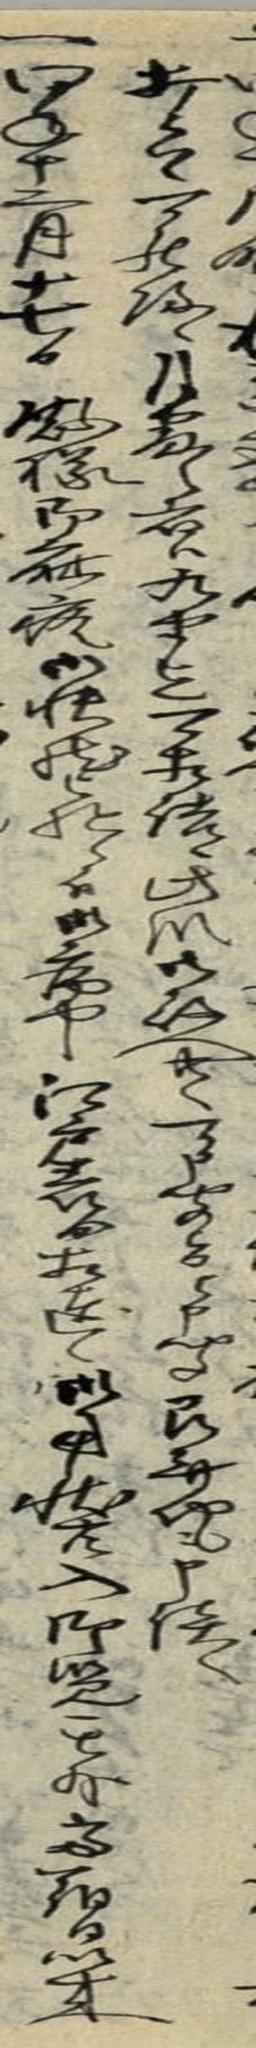一同年十二月十七日殿様御麻疹御快然被遊候に付御病中江戸表ゟ相達候御用状共入御覧其外当朔日以来
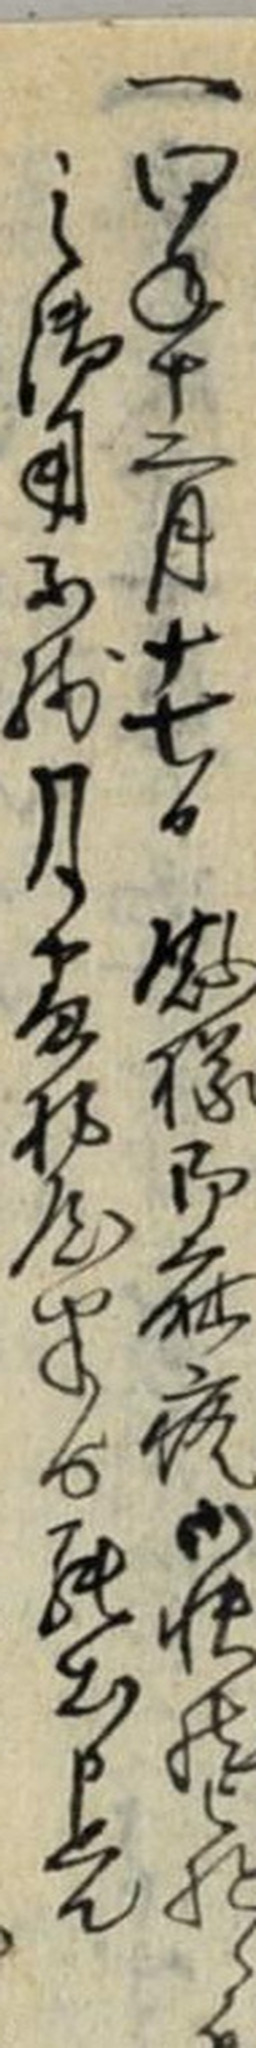之御用不残月番栃屋半右衛門罷出申上る
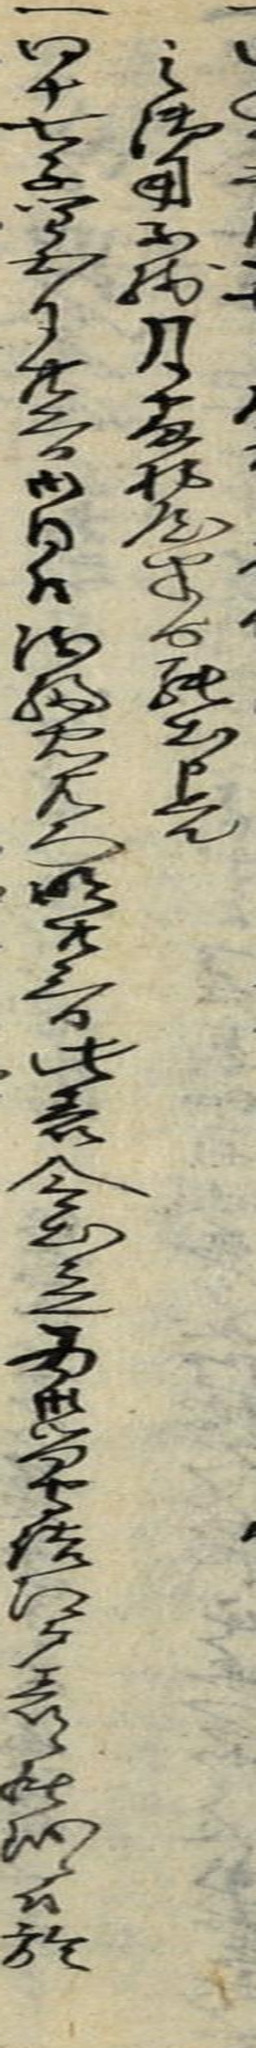一同十七子閏五月廿二日御目付海福忠左衛門明廿三日此表令出立為御留守詰江戸表へ罷越候に付於
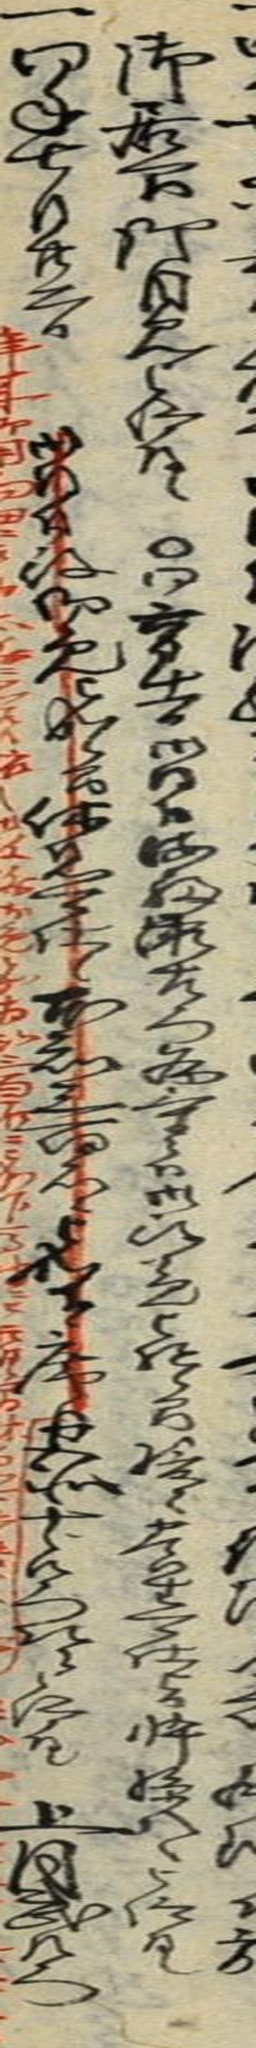一同年七月廿二日御目付役御免被成候間休息可仕候本知三百石被成下席宮北十郎左衛門次に被仰付候上月武左衛門
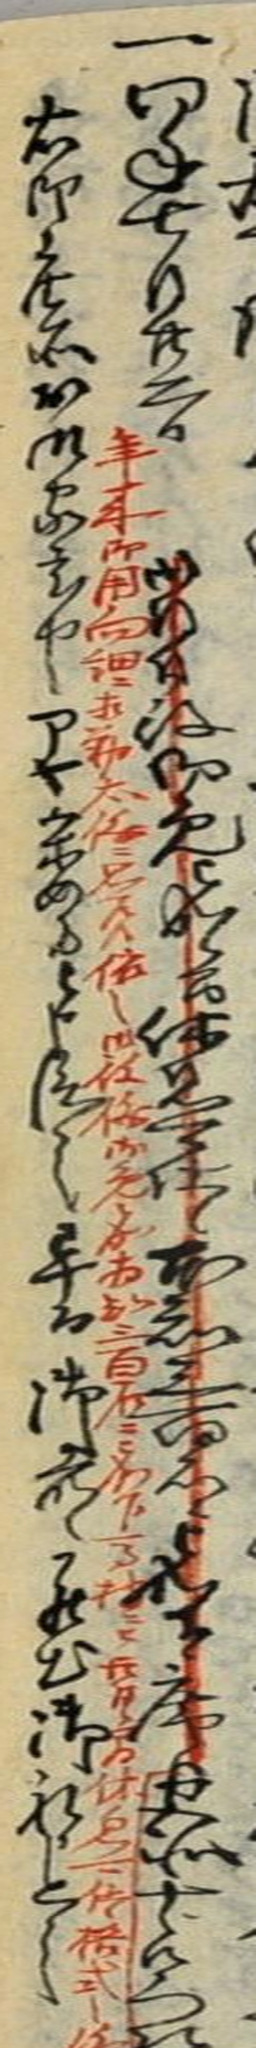右御座所於御家老中部屋采女方被申渡之畢而御前へ罷出御礼申上之
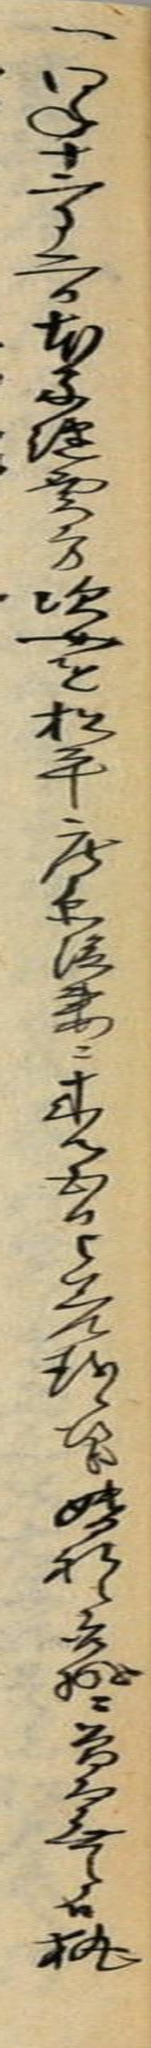一同年十二月二日本多縫殿方次女を松平庄兵衛後妻に来る五日被差越候得共婚礼之取扱に曽而無之に付執
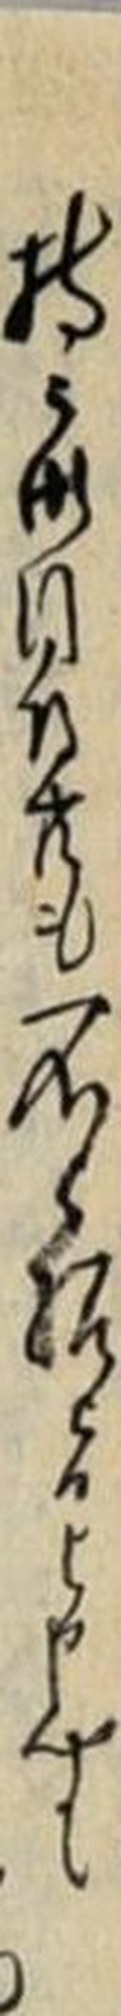持に御目付共も不被招旨被申聞候
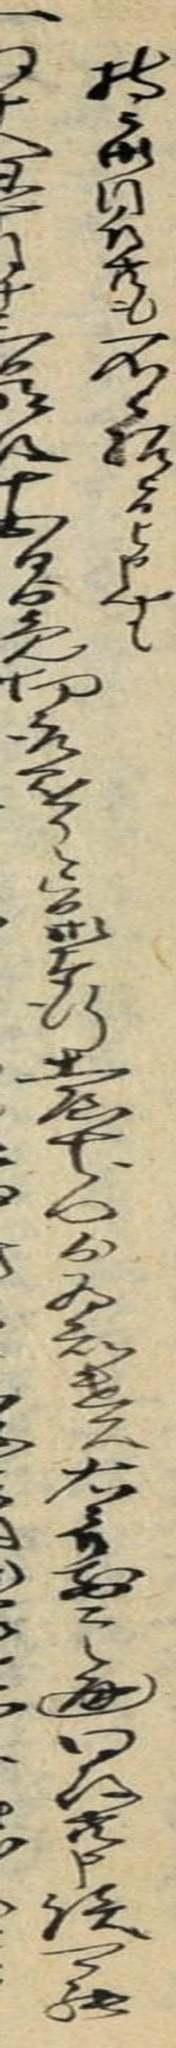一同十八丑十月十三日明後十五日ゟ免切取懸り候旨御奉行土屋十郎右衛門ゟ為知遣す右に付前々之通同役共申談可罷
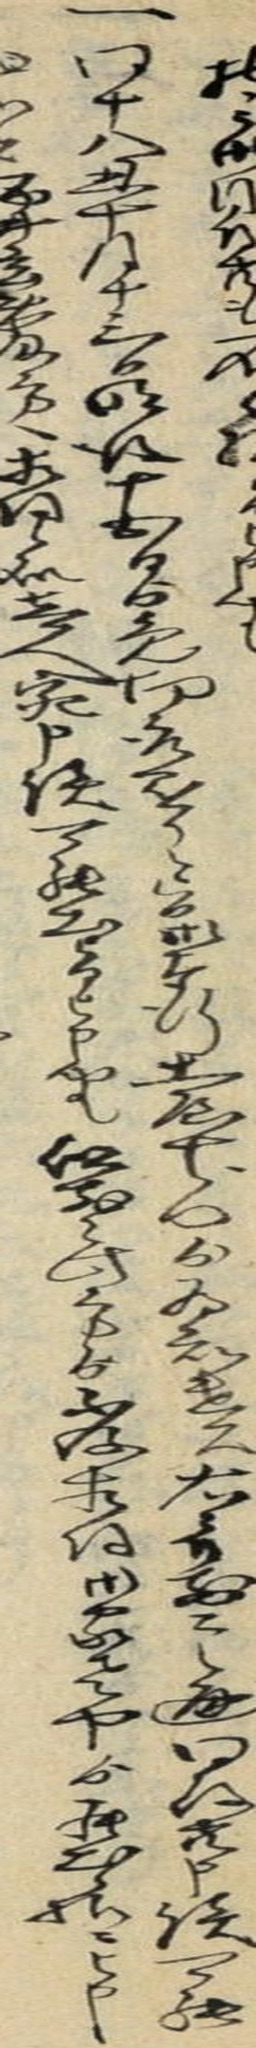出哉と酒井玄蕃方へ相伺候処壱人宛申談可罷出旨被申聞候但前々此方ゟ不及相伺御家老中ゟ罷出候様に被申
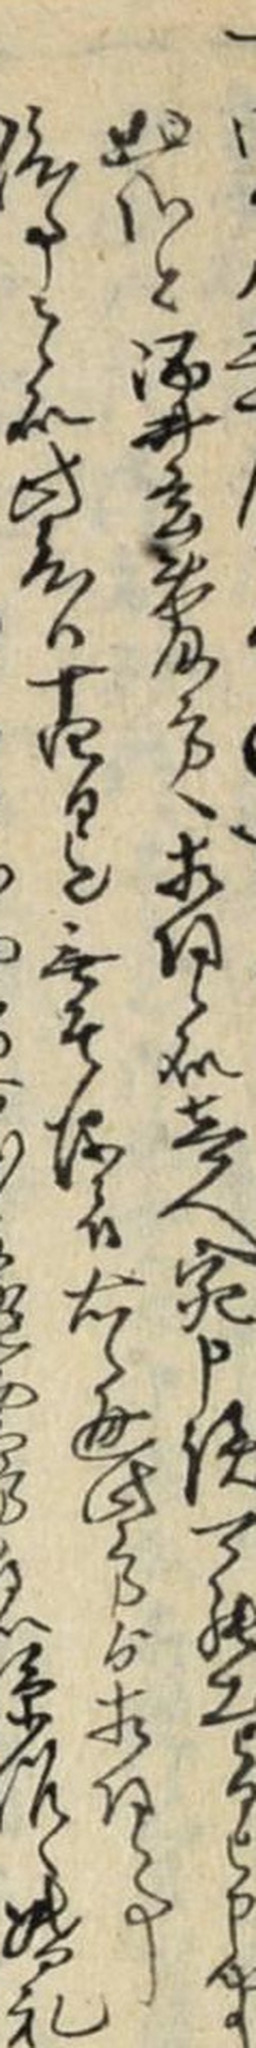渡事に候処此度は十四日迄無其儀に付右之通此方ゟ相伺候事
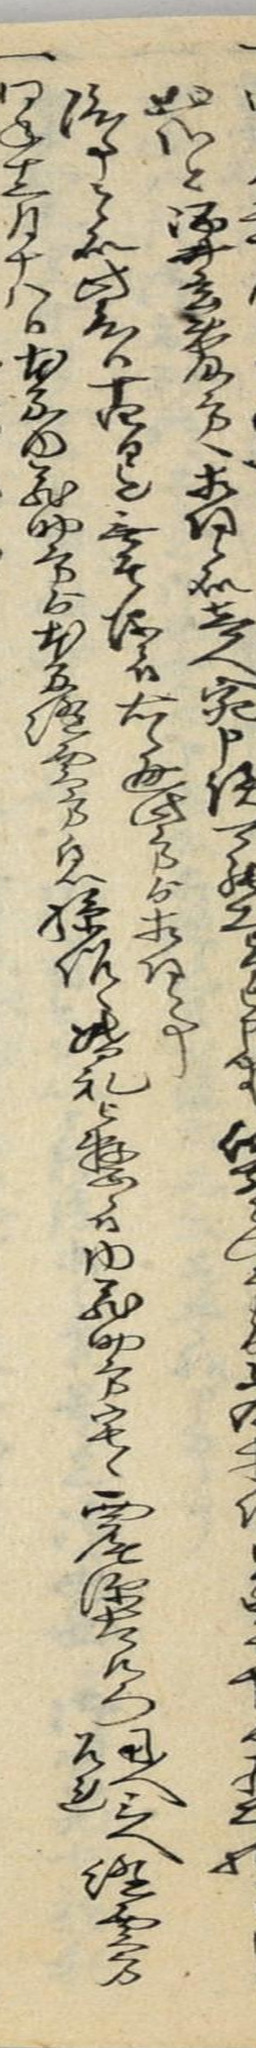一同年十二月十八日本多内蔵助方ゟ本多縫殿方息孫作之婚礼被整候付内蔵助方宅へ西尾源太左衛門用人三人召連縫殿方
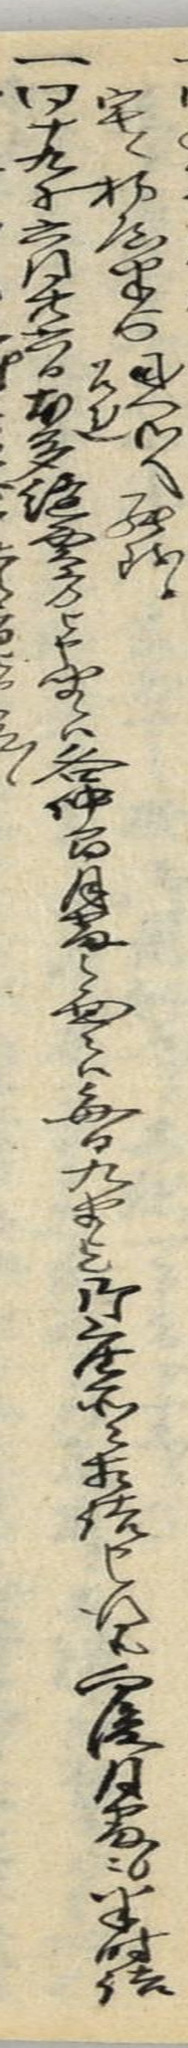一同十九寅六月廿六日本多縫殿方被申聞候は各仲間月番之面々は毎日九半迄御座所に相詰申候得共向後月番も半時詰
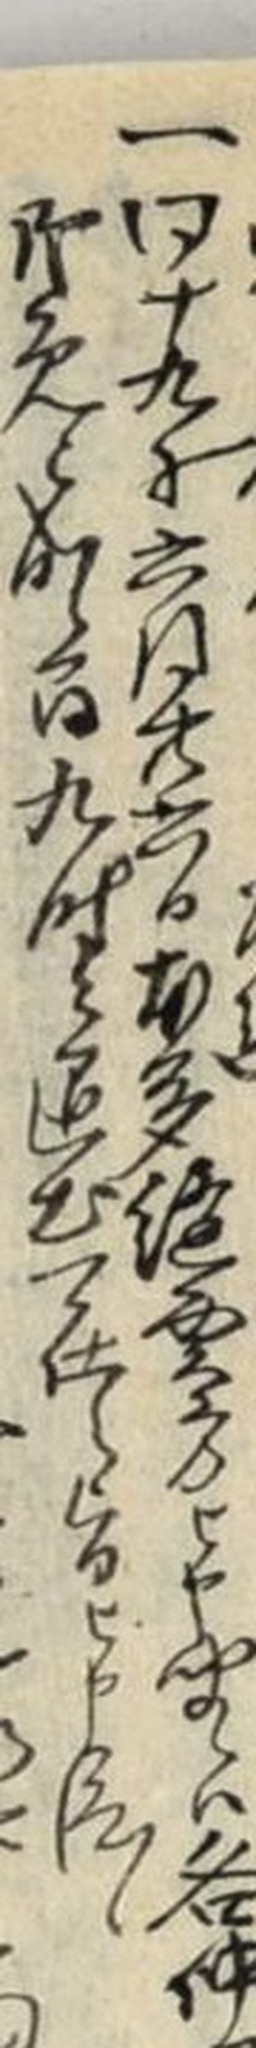御免被成候間九時に退出可仕候旨被申渡候
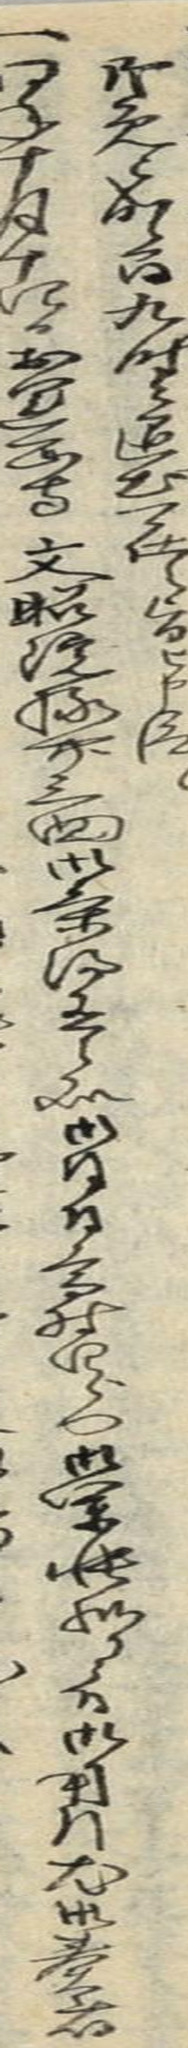一同年十月十四日於運正寺文昭院様廿三回御茶湯有之候処御目付高村四郎右衛門御軍帳掛りに付御用引尤御奏者
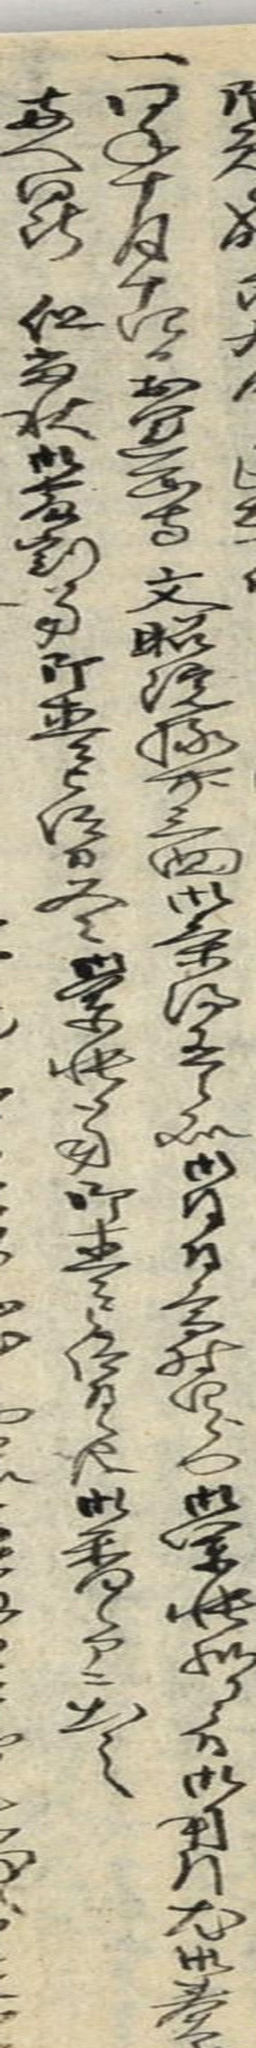両人同断但当秋御番割御用御直々被仰付又々御軍帳御用御直々被仰付候儀御番之部に出之
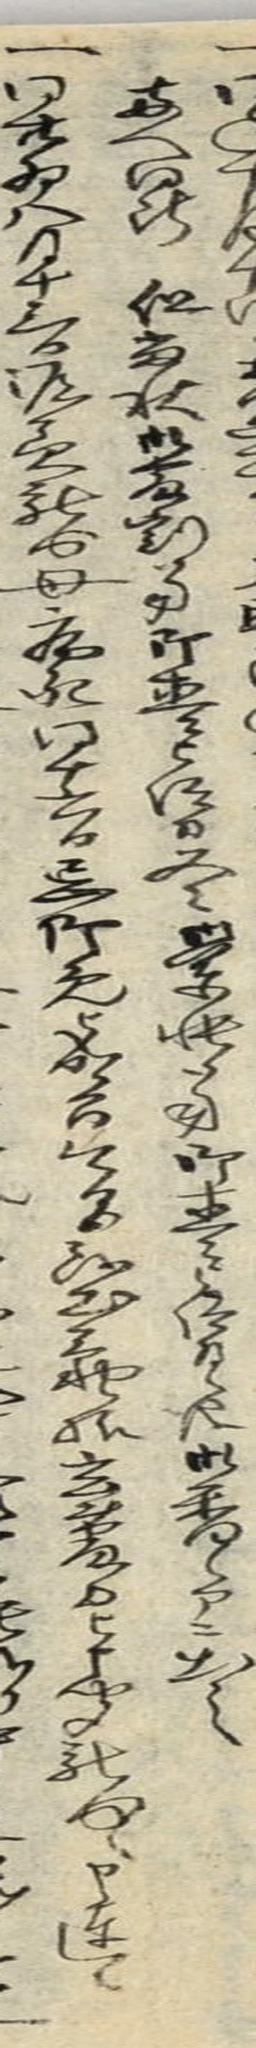一同廿卯八月十三日渥美新右衛門母病死同十六日忌御免被成候間今日ゟ致出勤候様玄蕃方被申聞新右衛門方へ申達候
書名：蒐輯之部
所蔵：福井県文書館 Fukui Prefectural Archives
